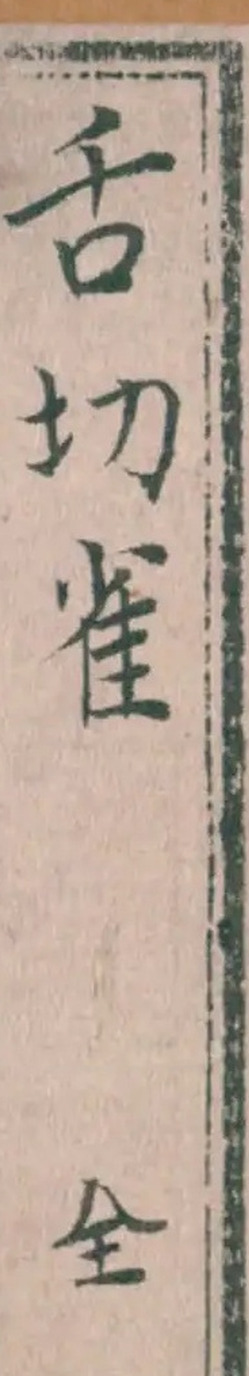舌切雀全

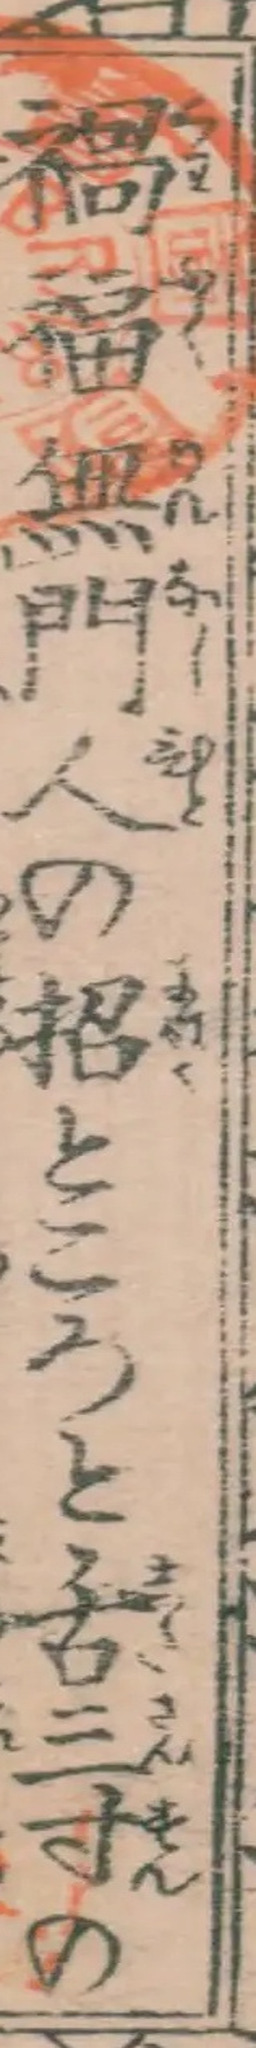禍福無門人の招ところと舌三寸の
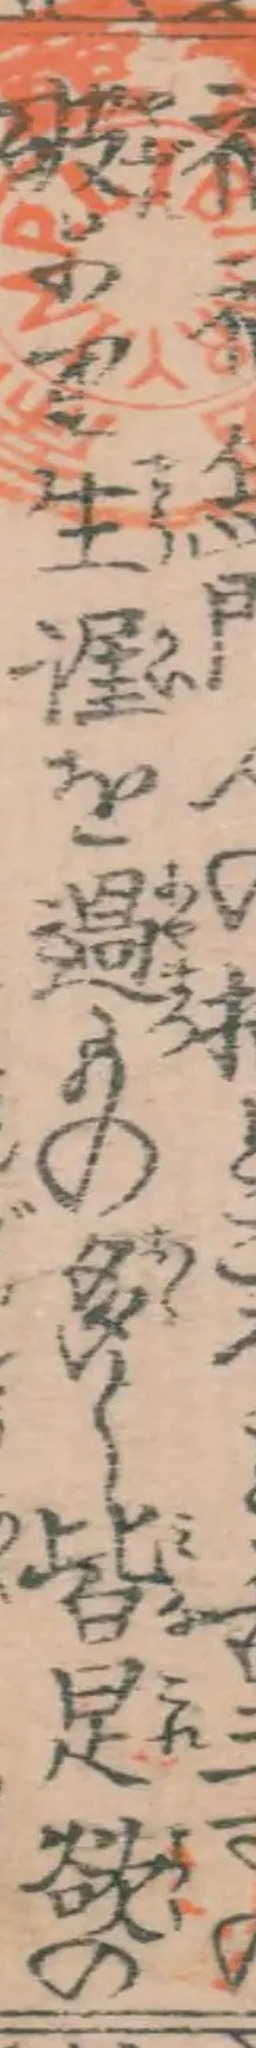破より生涯を過もの多く皆是欲の
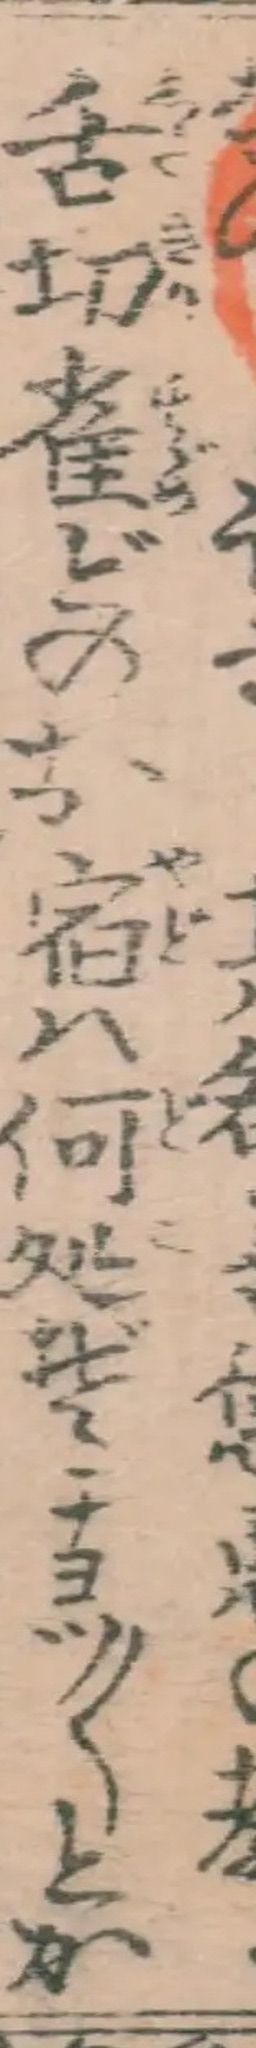舌切雀どのお宿は何処ぞチヨツ〳〵とか
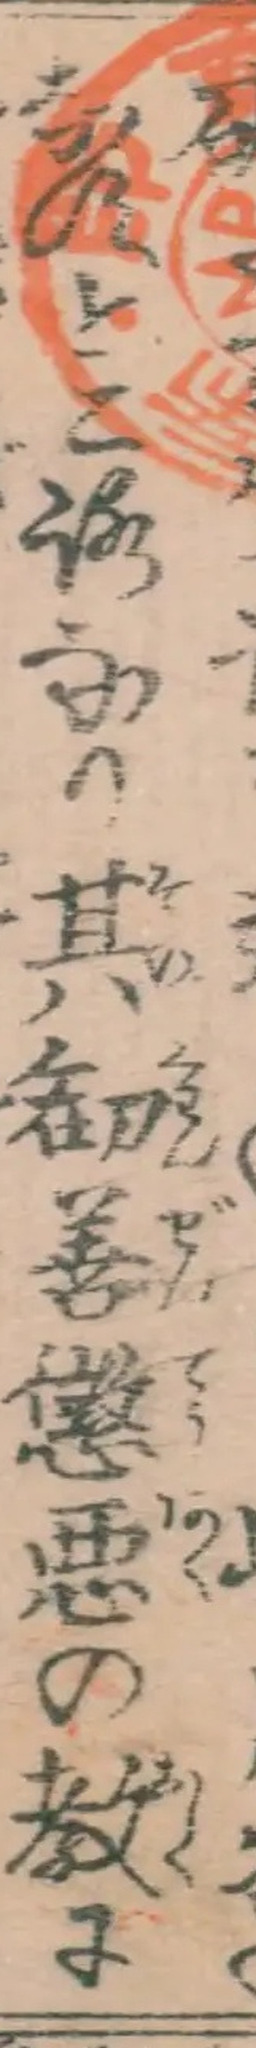なすところなり其勧善懲悪の教に
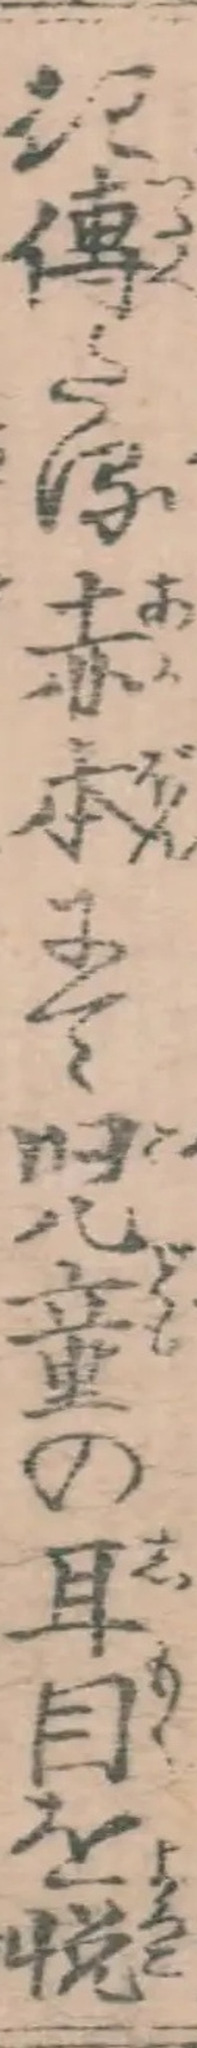き伝たる赤本にて児童の耳目を悦
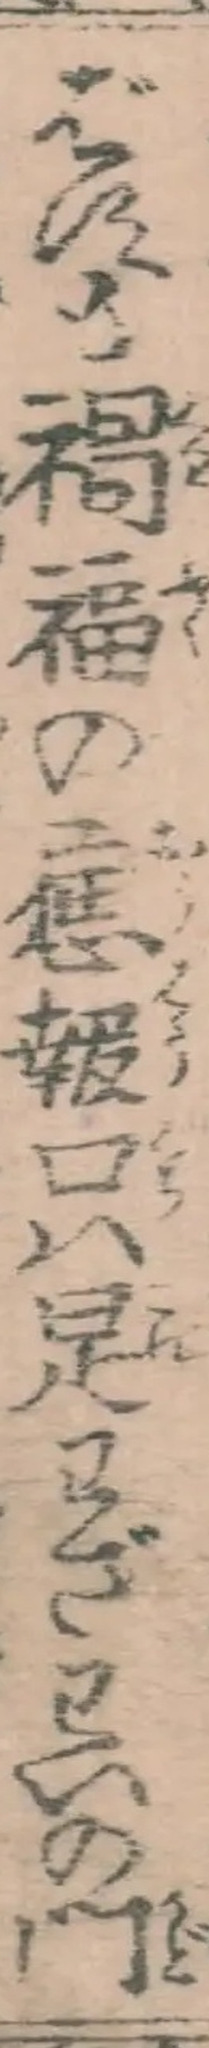ばすも禍福の応報口は是わざわいの門
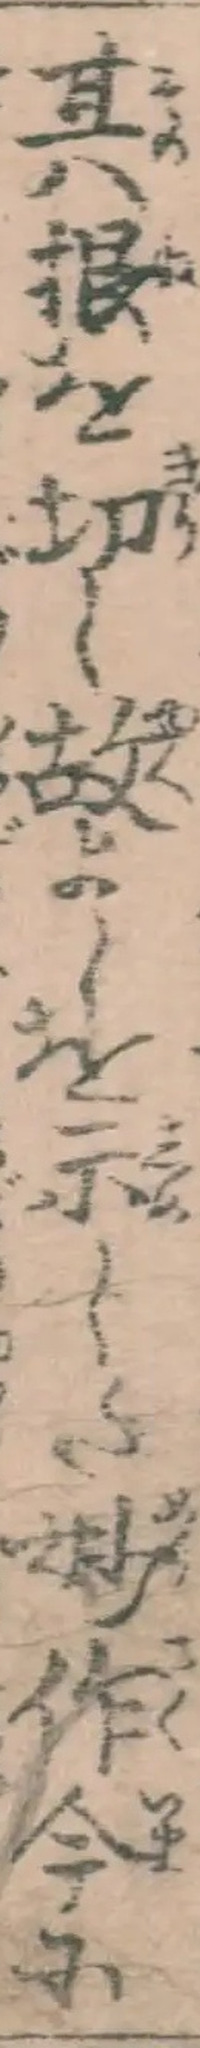其根を切し故よしを示した妙作今に
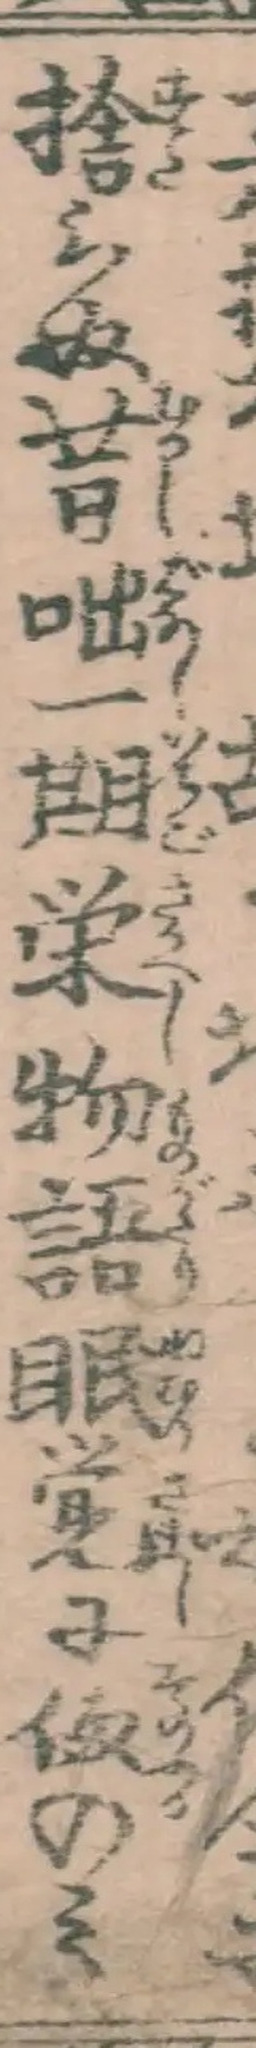捨らぬ昔咄一期栄物語眠覚に備のみ

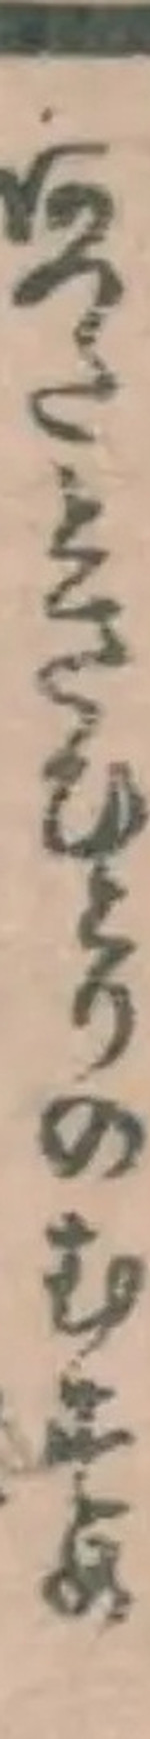あつたとさひとりのむすめ
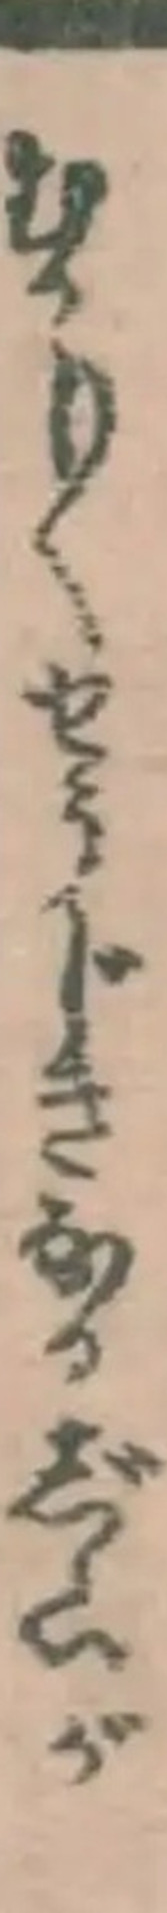むかし〳〵せうじきなるじゝいが
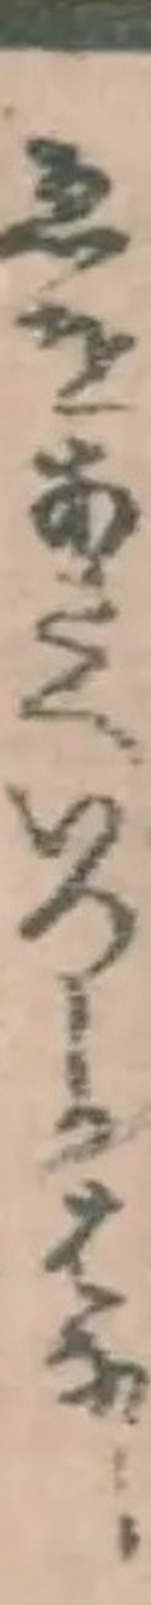ゑをあたへいつしかはなし
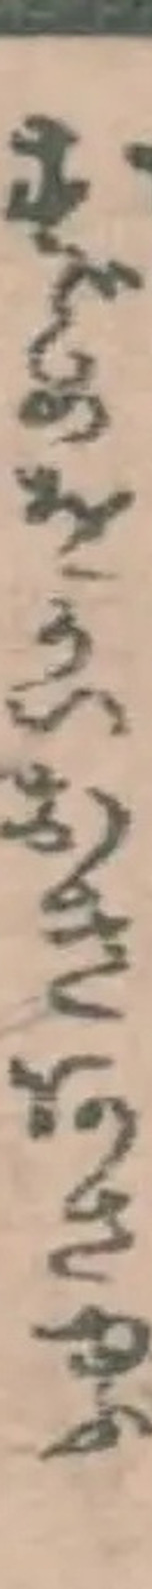すゞめをかいおきあさゆふ
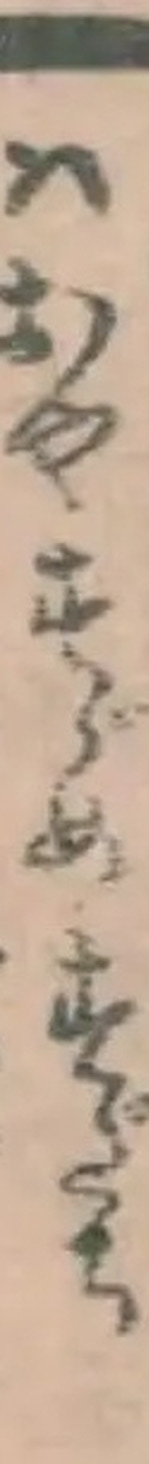はおやすゞめすだち
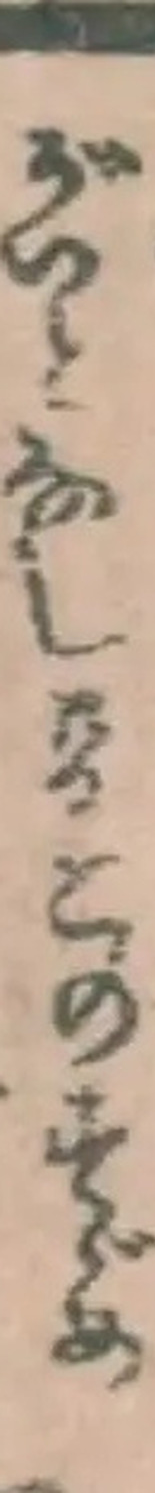がいとなしけるこのすゞめ
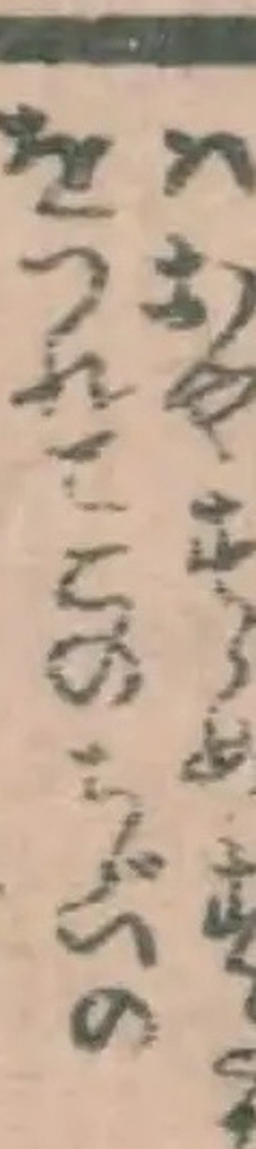をつれてこのちゞいの
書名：舌切雀
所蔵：国立国会図書館 National Diet Library, JAPAN
